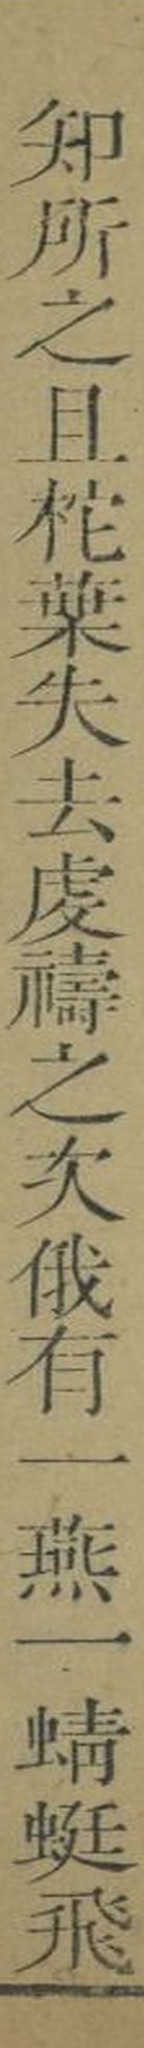知所之且柁葉失去䖍禱之次俄有一燕一蜻蜓飛
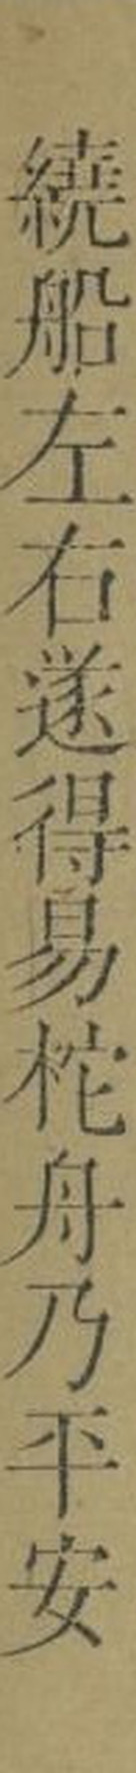繞船左右遂得易柁舟乃平安

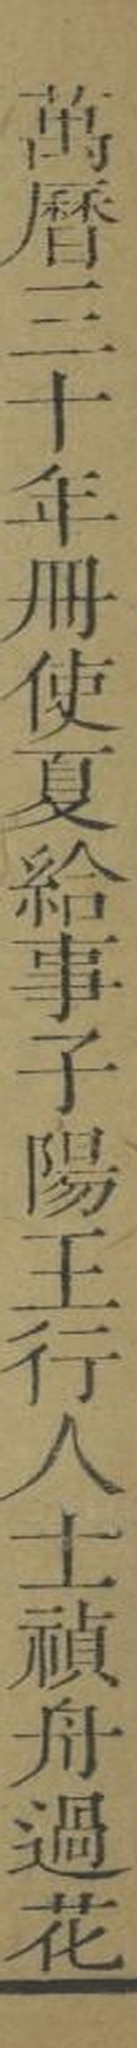萬曆三十年冊使夏給事子陽王行人士禎舟過花
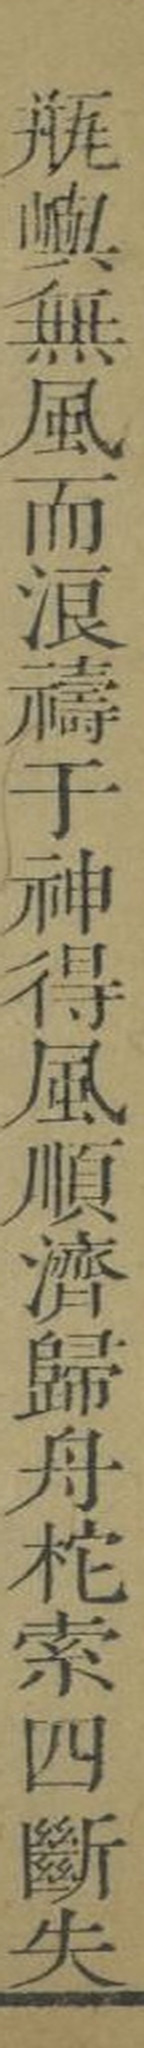瓶嶼無風而浪禱于神得風順濟歸舟柁索四斷失
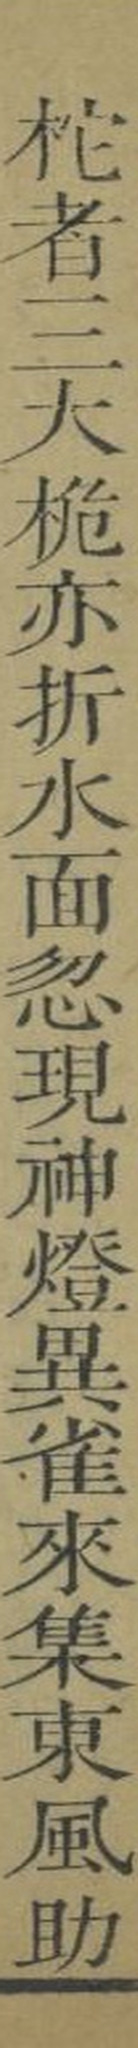柁者三大桅亦折水面忽現神燈異雀來集東風助
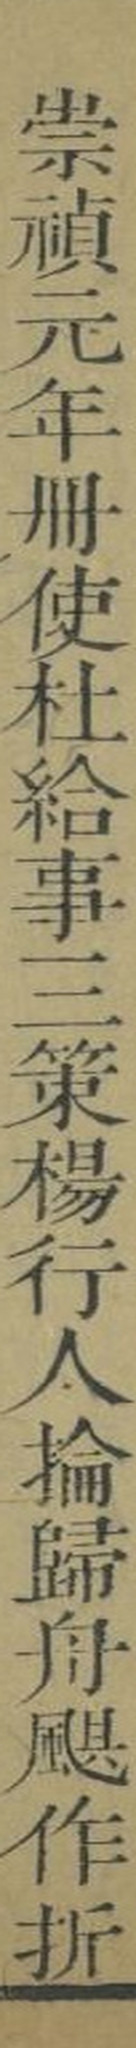崇禎元年冊使杜給事三策楊行人掄歸舟颶作折
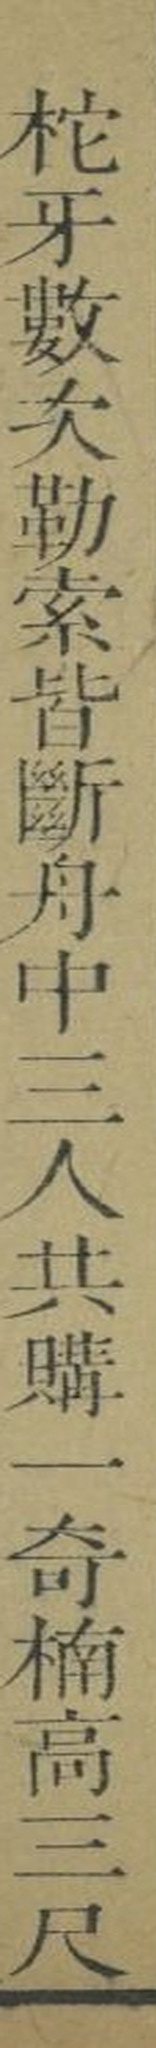柁牙數次勒索皆斷舟中三人共購一奇楠高三尺
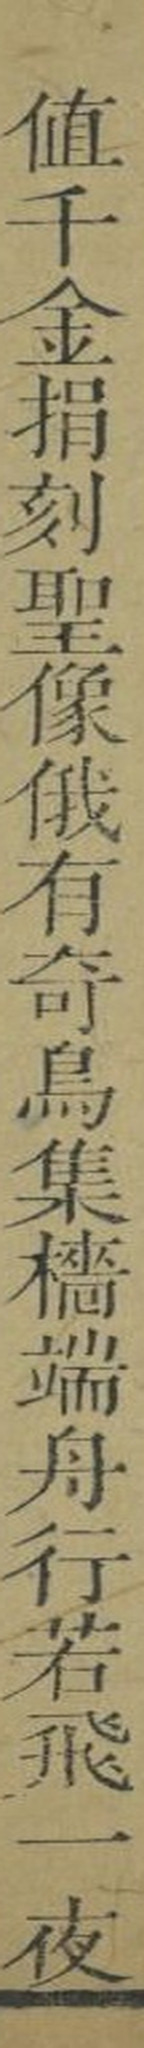値千金捐刻聖像俄有奇鳥集檣端舟行若飛一夜
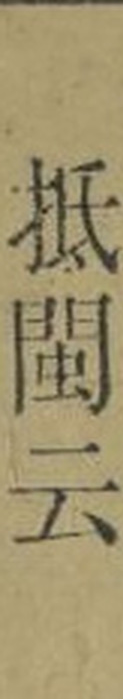抵閩云
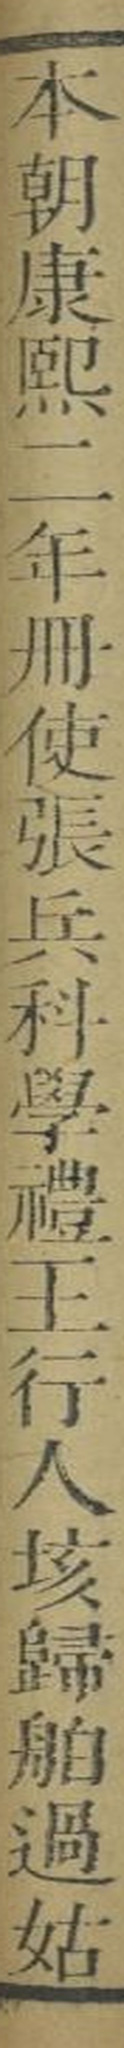本朝康熙二年冊使張兵科學禮王行人垓歸舶過姑
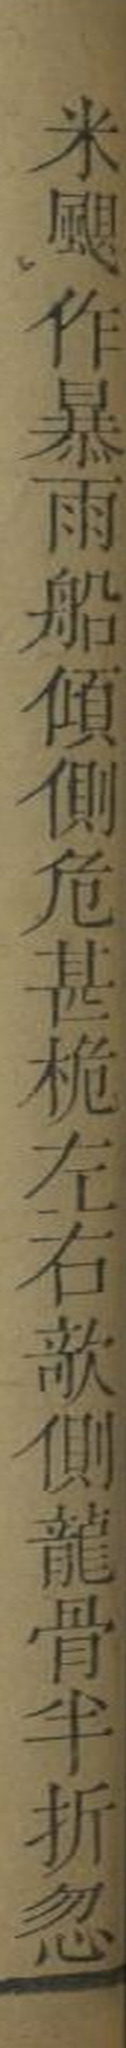米颶作暴雨船傾側危甚桅左右欹側龍骨半折忽
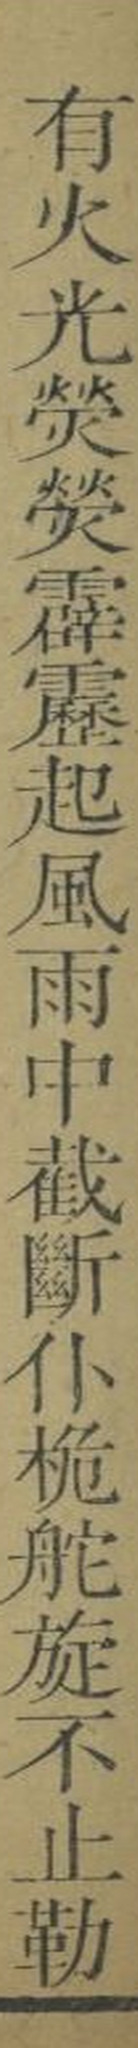有火光熒熒霹靂起風雨中截斷仆桅舵旋不止勒
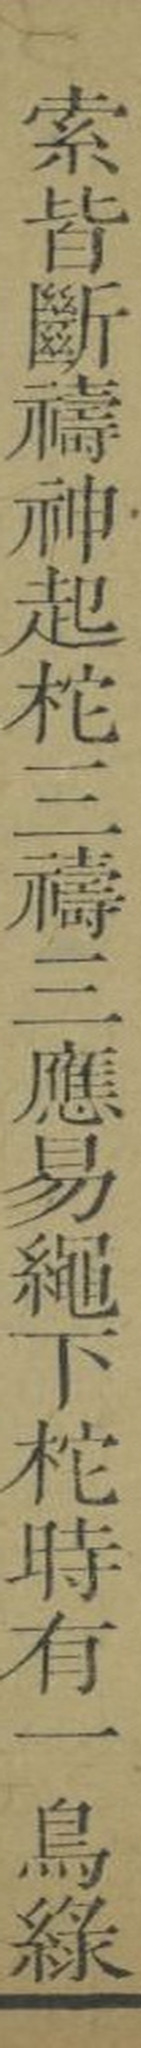索皆斷禱神起柁三禱三應易繩下柁時有一鳥綠
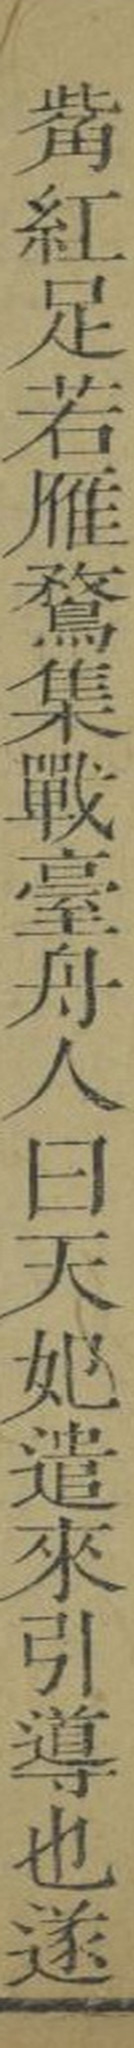觜紅足若雁鶩集戰臺舟人曰天妃遣來引導也遂
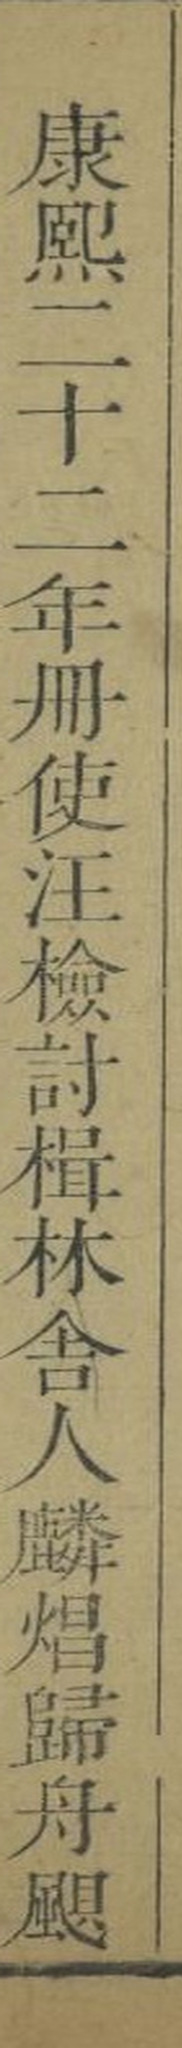康熙二十二年冊使汪檢討楫林舎人麟焻歸舟颶
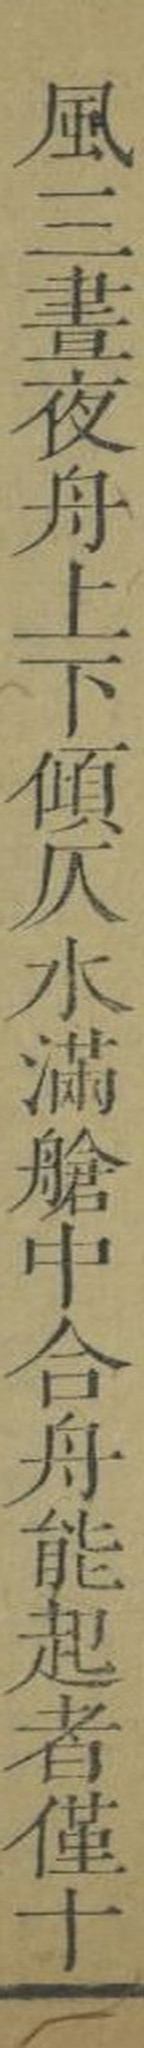風三晝夜舟上下傾仄水滿艙中合舟能起者僅十
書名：中山伝信録 巻一
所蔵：University of the Ryukyus Library
